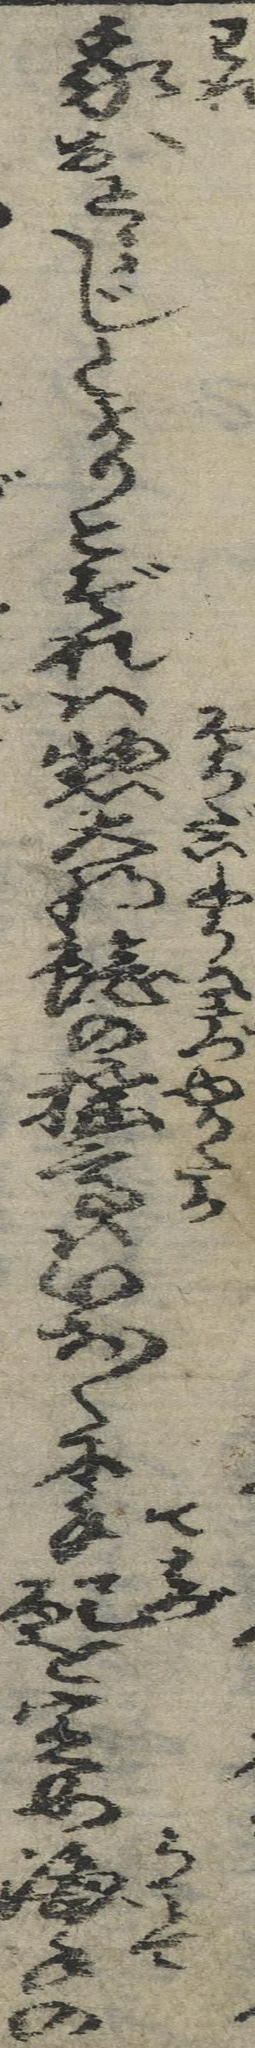我おとらじとよりとぞれは惣大将鯰の揺高はいおくに手配を突め海手の
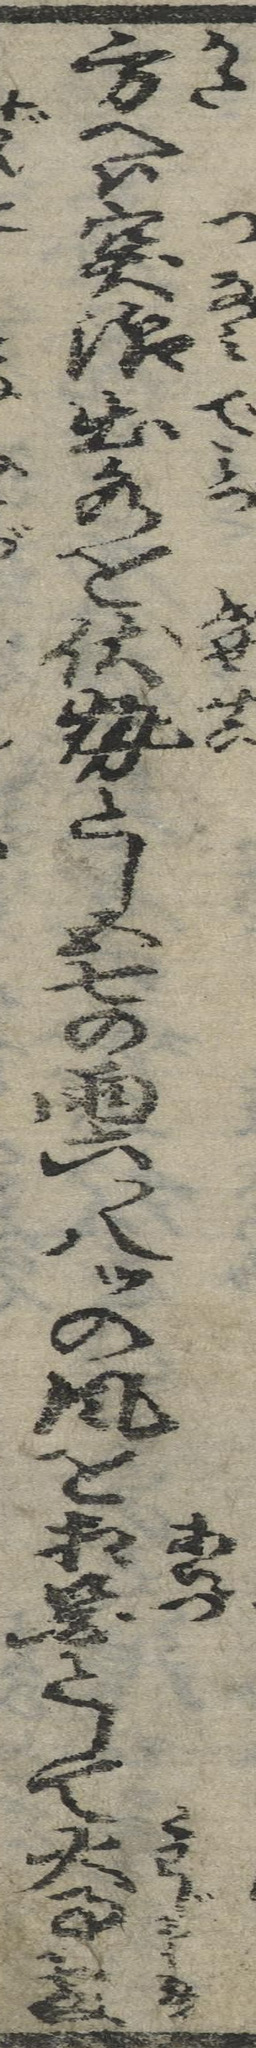方へは突浪出水を伏勢とし五七の雨六つ八ツの風を相図として火事雷
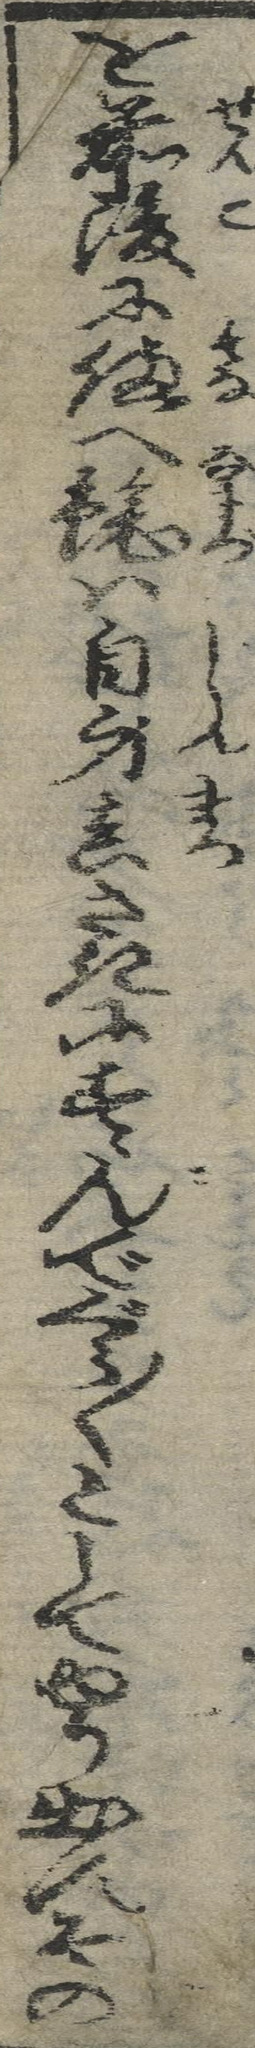を前後に備へ鯰は自身真さきにとんでぐら〳〵としてゆう出んその

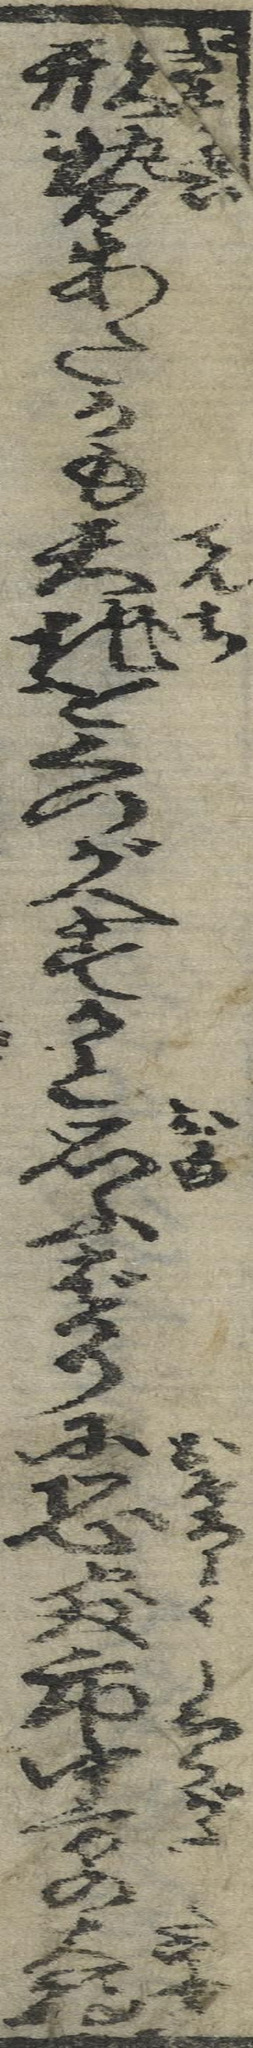形勢あたかも天地をくりがへすかと思ふばかりに恐敷市中方の大将
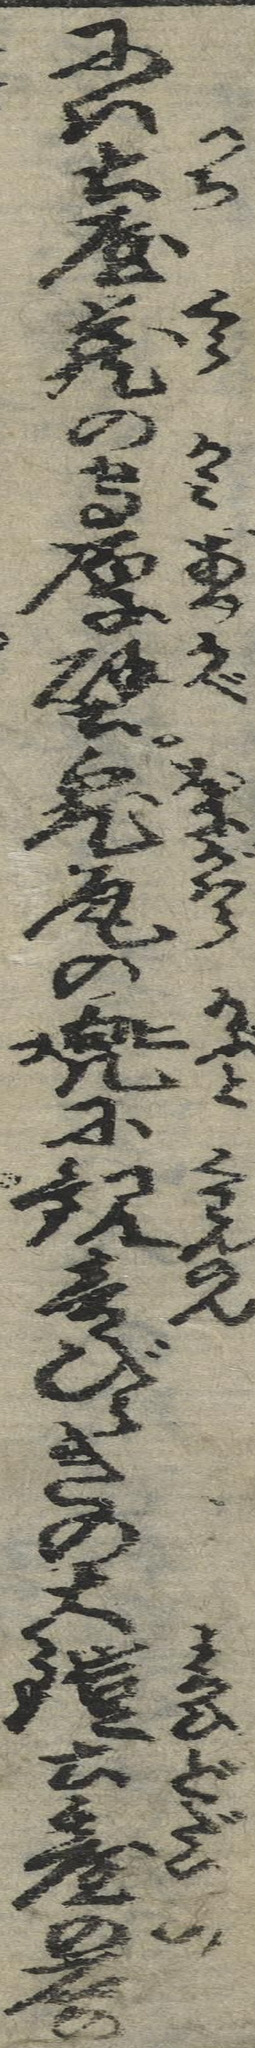には土屋蔵の守厚壁。鬼瓦の兜に観音びらきの大鎧土台の石の
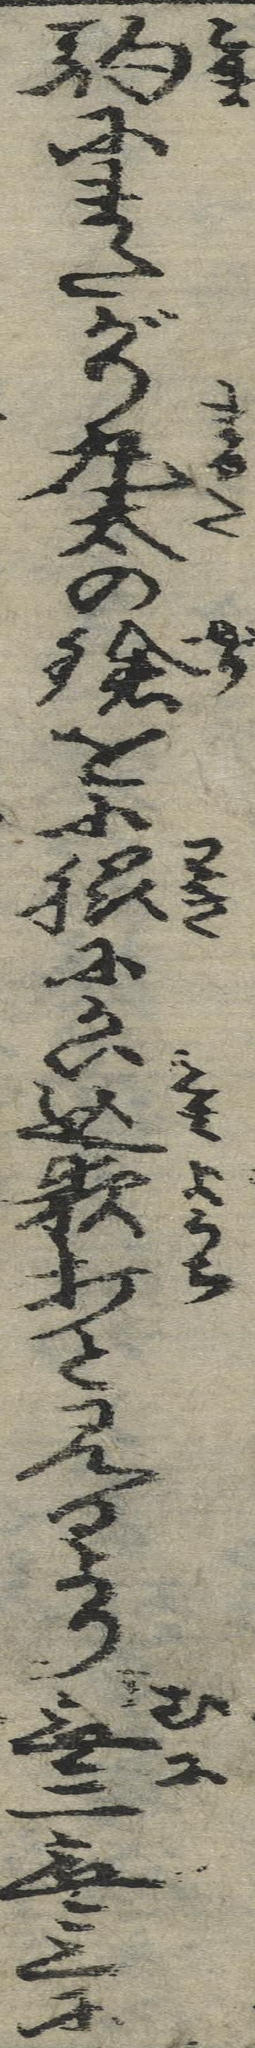駒にまたがり丸太の槍を小掖にかい込夜打と見るより無二無三に
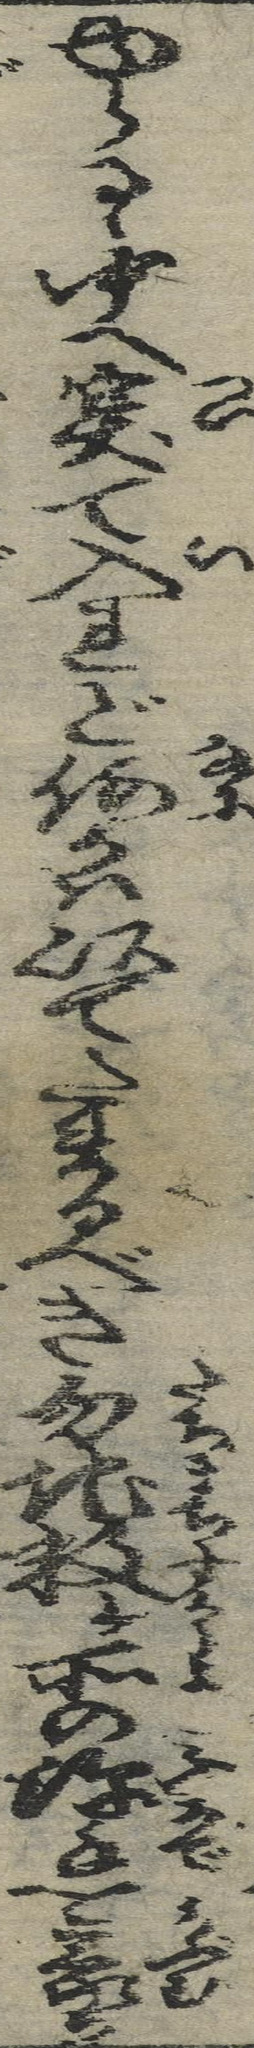ゆらすゆへ突て入れど何かは以てたれかるべき忽地数ヶ所深手を蒙り
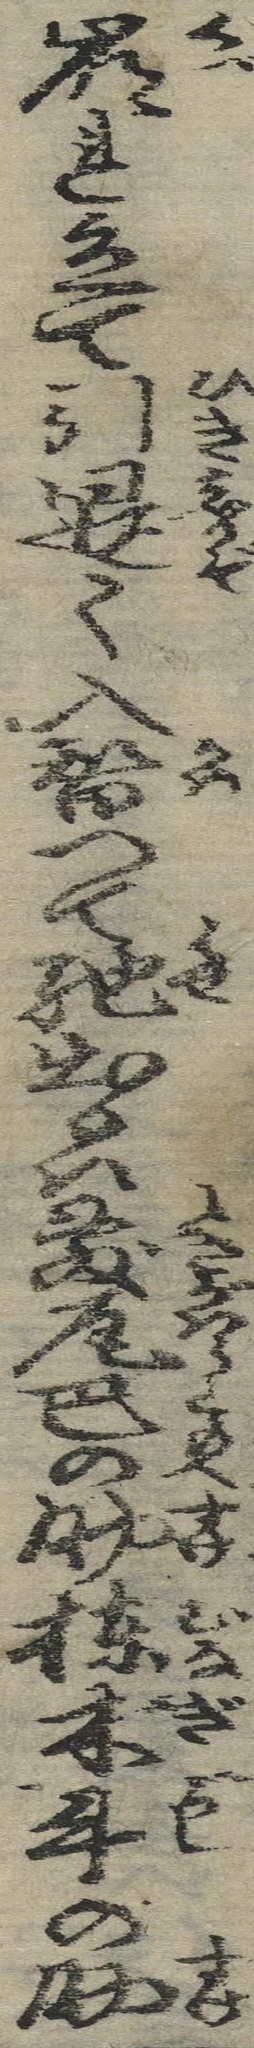崩れ立て引退く入替つて馳出るは敷瓦巴の助棟木牛の助
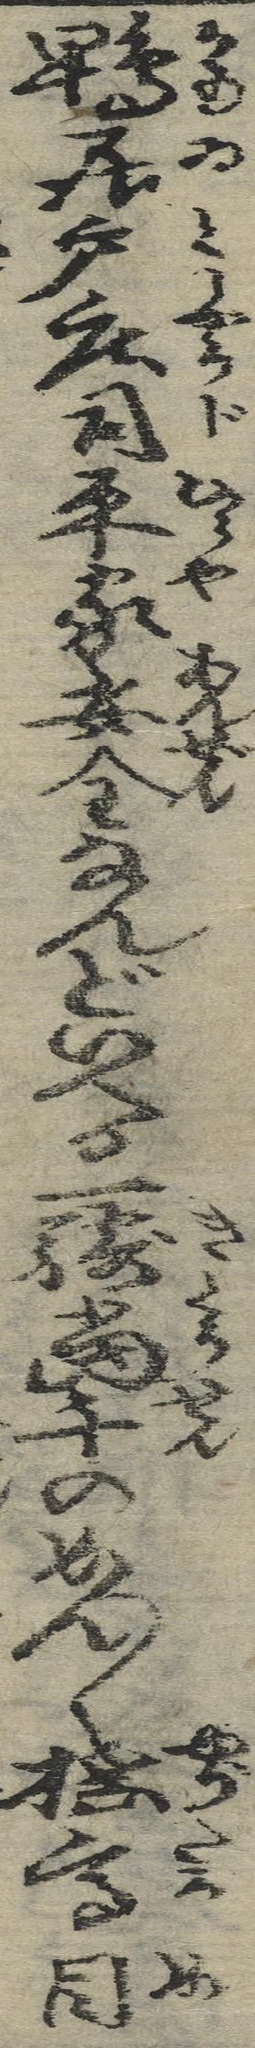鴨居戸庄司平屋安全なんどいへる一騎当千のめん〳〵揺高目
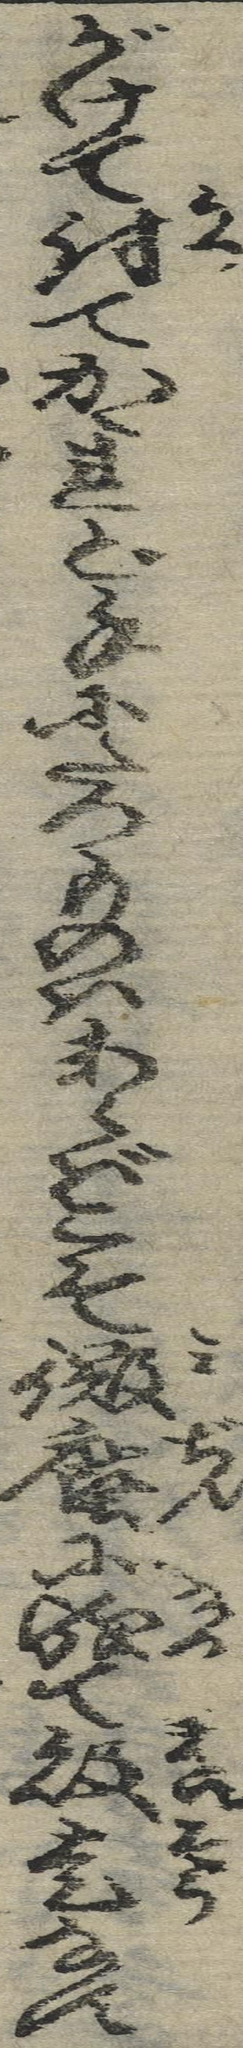がけて打てかヽれど手にたつものはあらばこそ微塵に成て敗走なす
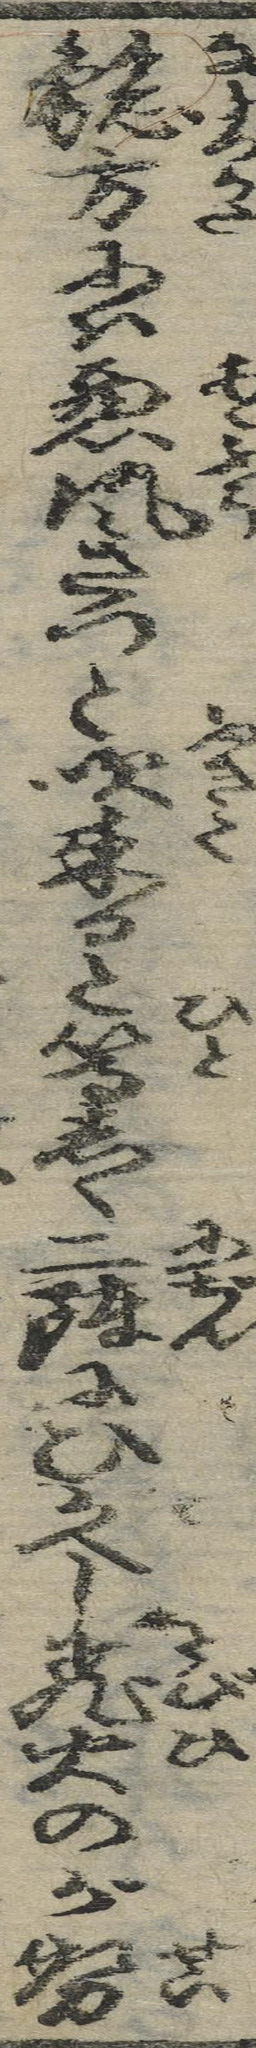鯰方には悪風さつと吹来ると等しく二陣にひかへし飛火のが勢
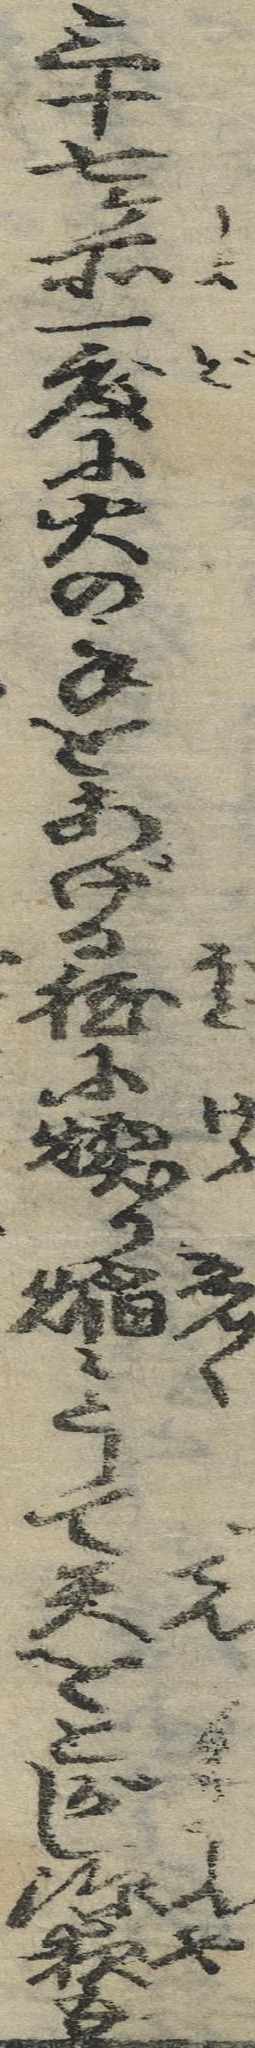三十七ヶ所一度に火の手をあげる程に煙り焔々として天をこがし深夜も
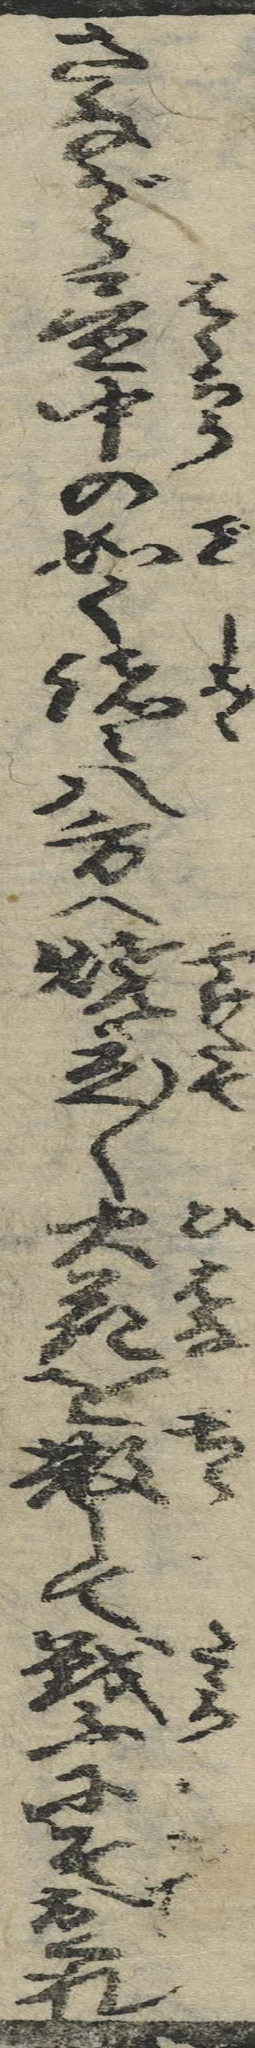さながら白中の如く諸々八方へ焼立〳〵火花を散して戦ふにそおくれ
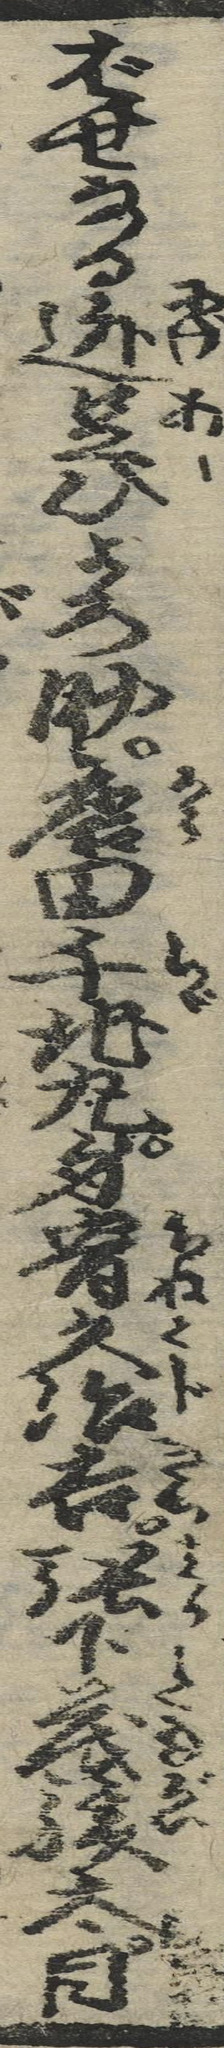ばせなる逃足ひょろ助。鹿田千地丸。身骨久治吉。張下蔵絵太。日
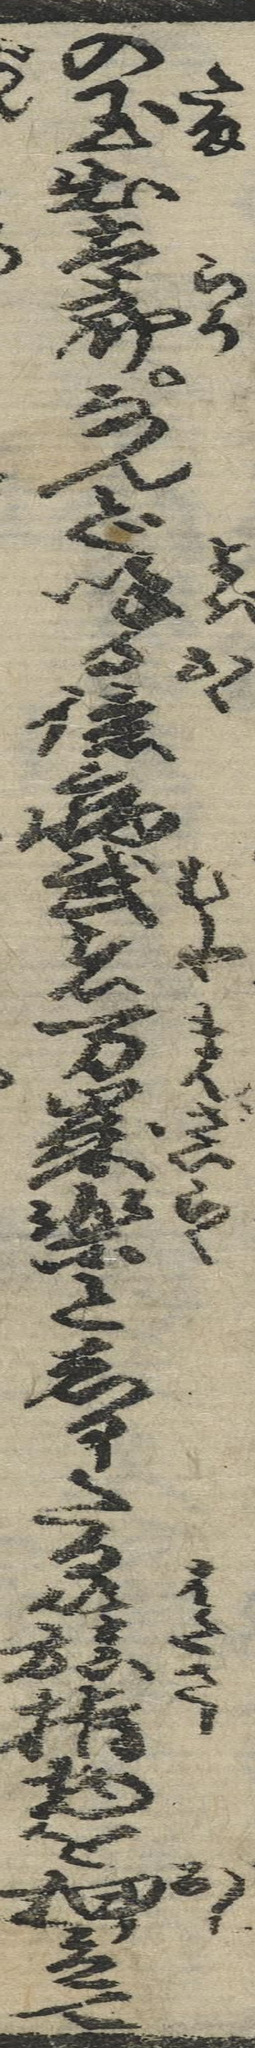の玉出太郎。なんど呼る係病武者万歳楽とし申たる御旗指物を押立て
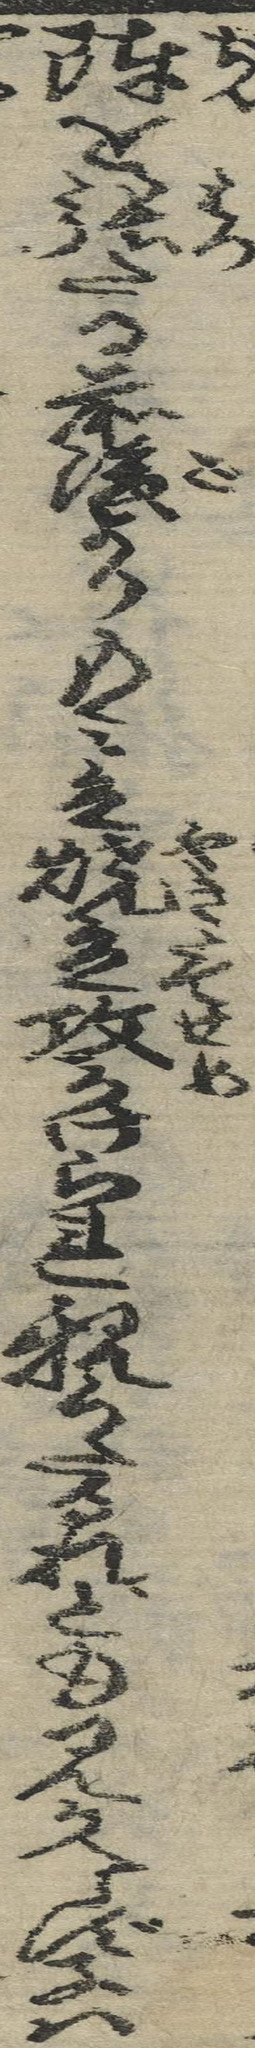陣を張たる前後よりも之立焼立攻かけられ親うたるれども見かへらずには
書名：鯰太平記混雑ばなし
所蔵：東京大学地震研究所図書室 Earthquake Research Institute Library, The University of Tokyo, JAPAN
